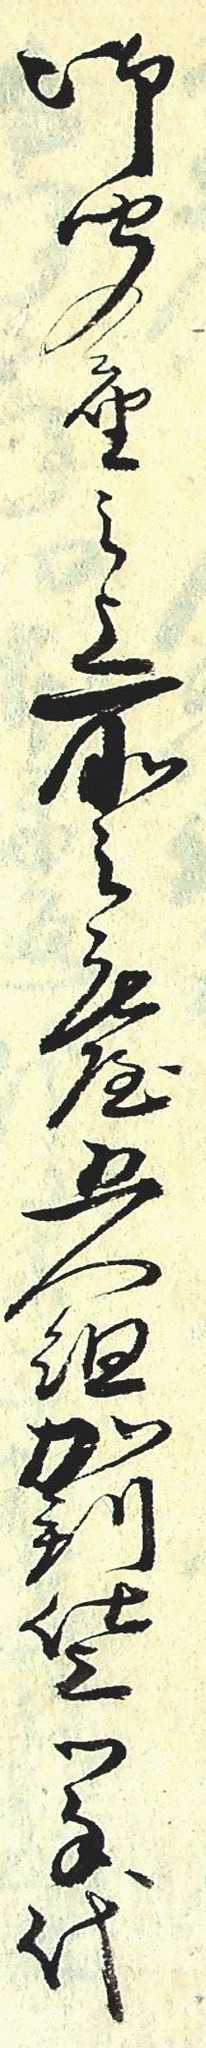御聞届之上所之庄屋五人組加判仕上御手代

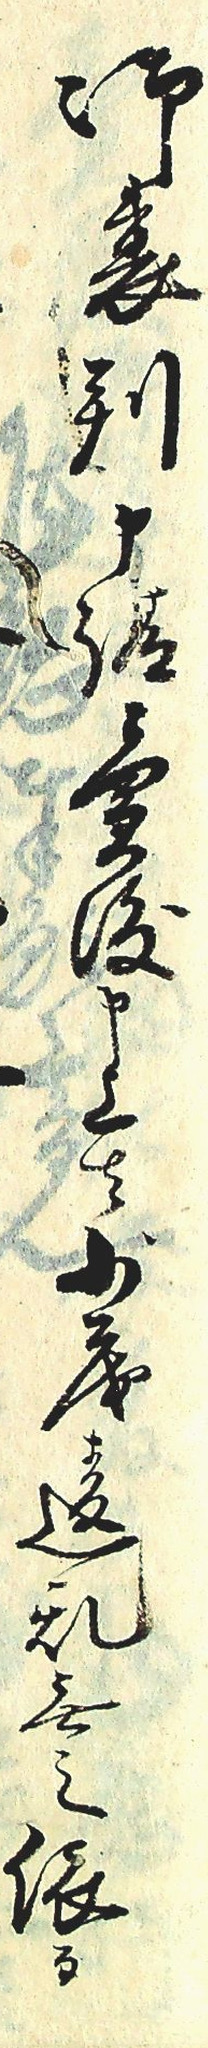御裏判申請売渡申上は少も違乱無之依て
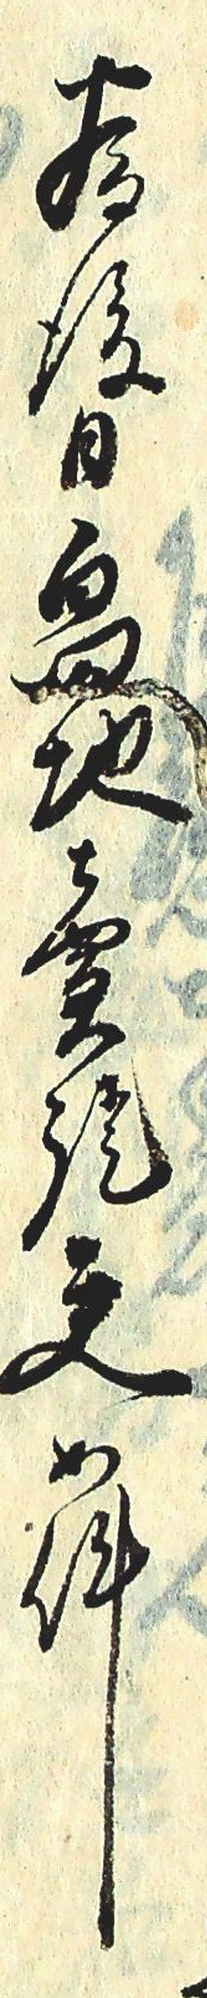為後日畠地売証文如件
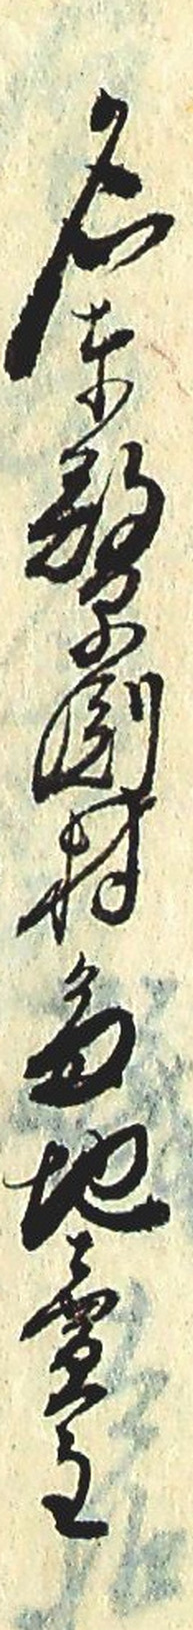名東郡早淵村畠地売主
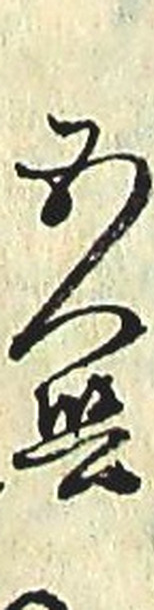五人与
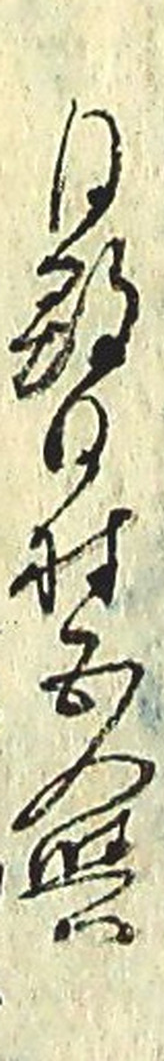同郡同村五人与
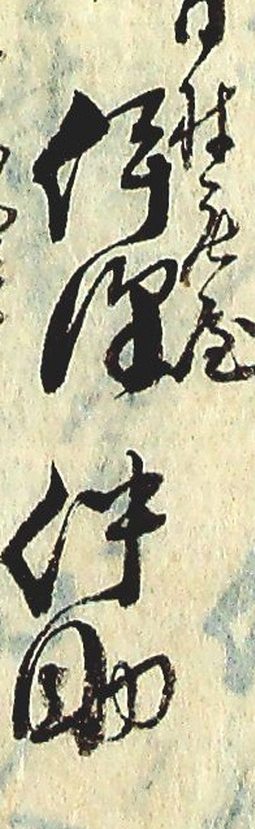伊沢仲助
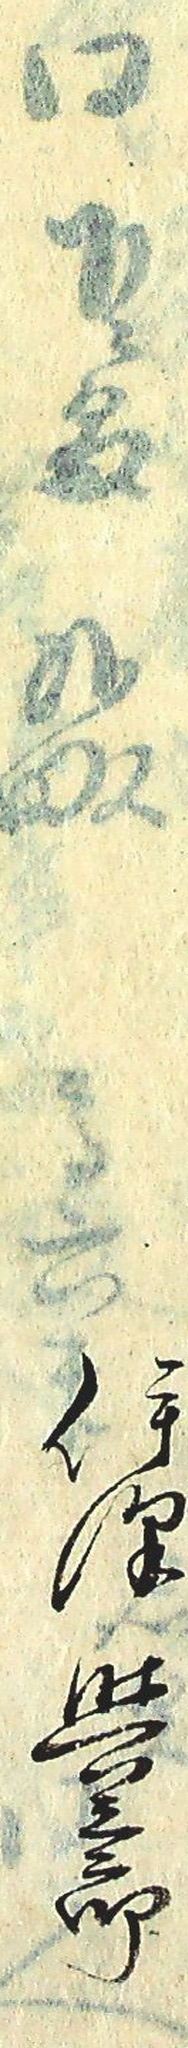伊沢与三郎
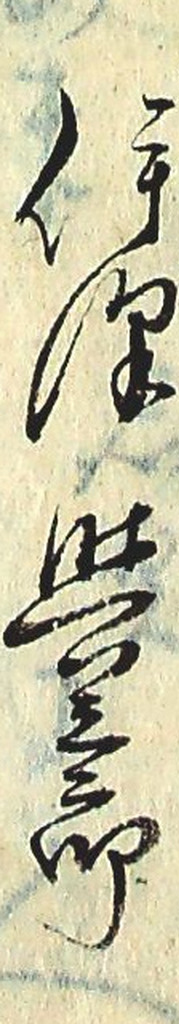伊沢与三郎
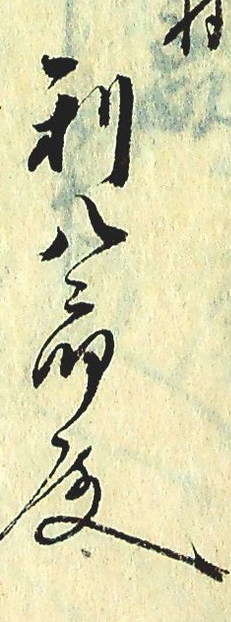利八郎殿

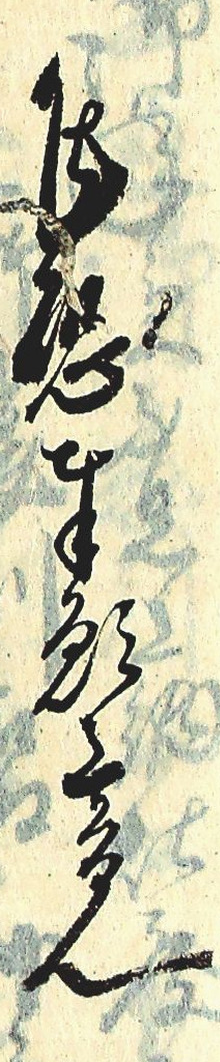乍恐奉願上覚
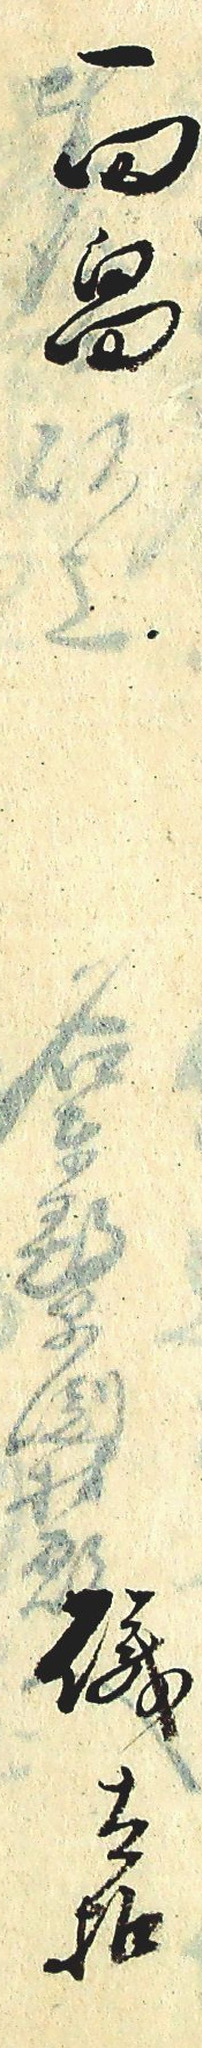一田畠磯太扣
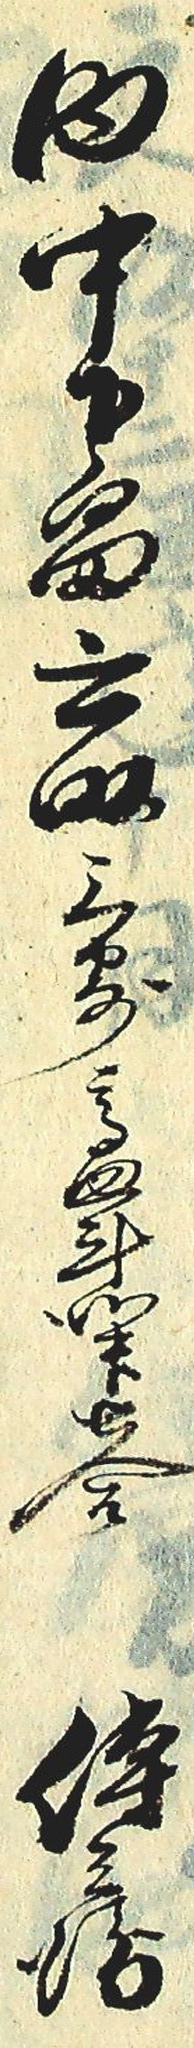内中下畠六畝三歩高四斗弐升七合伝兵衛
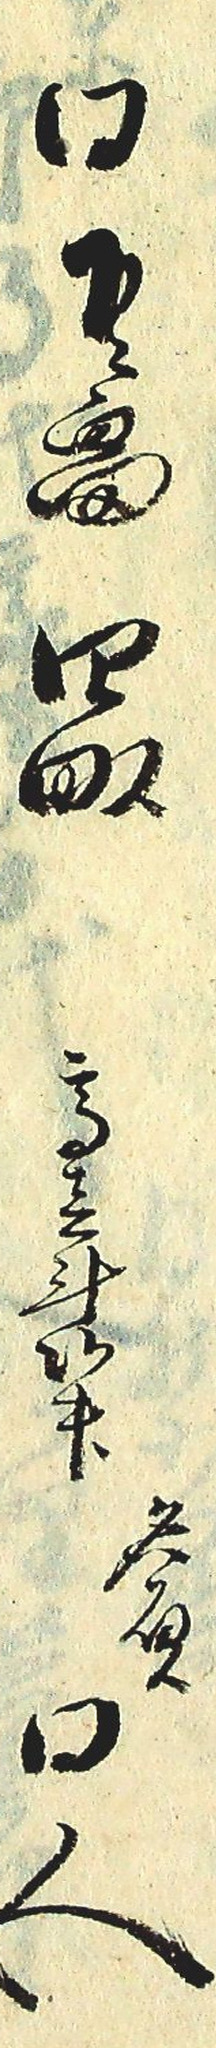同下々畠四畝高壱斗弐升同人
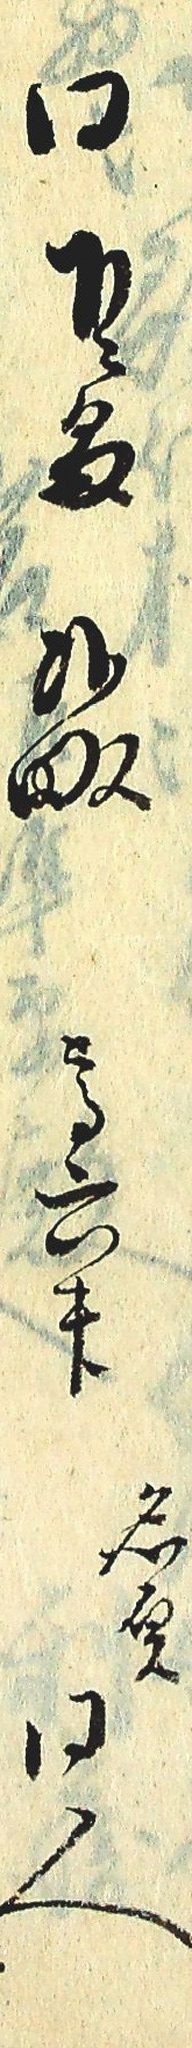同下々畠弐畝高六升同人
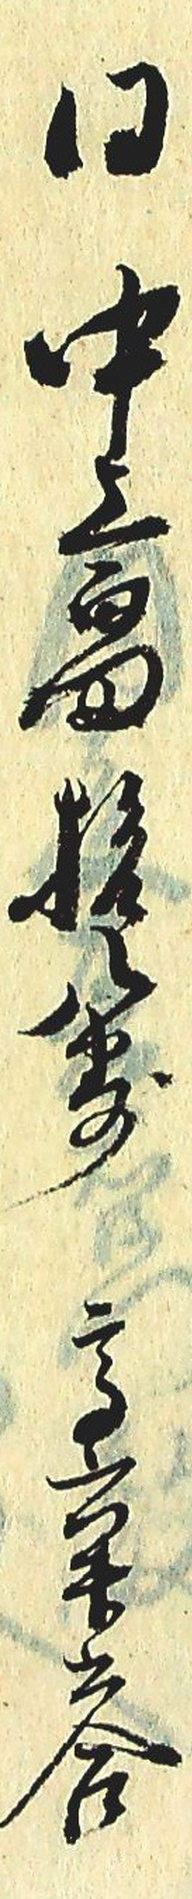同中上畠拾八歩高六升六合同人
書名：諸御願書控(弐番）
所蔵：鳴門教育大学 Naruto University of Education
